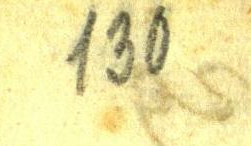130
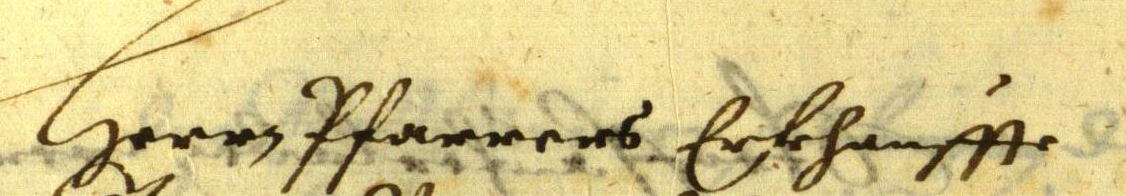Herrn Pfarrers Erkhaūffte
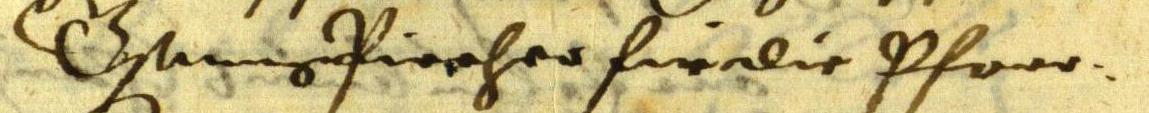GsangPiecher fir die Pfarr-
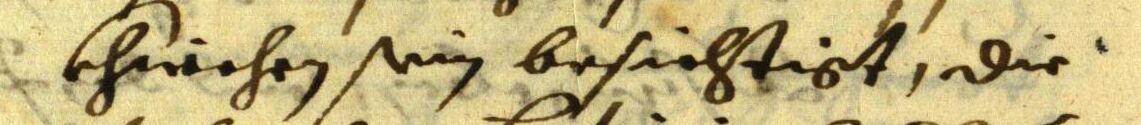khirchen sein besichtigt, die
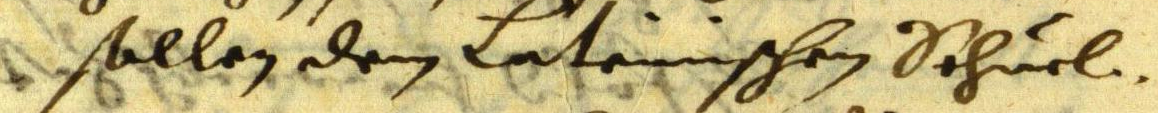sollen dem Lateinischen Schūel¬
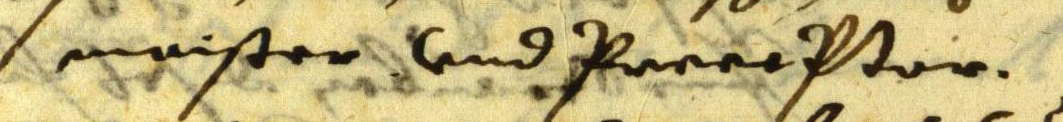maister vnd PrecePtor.
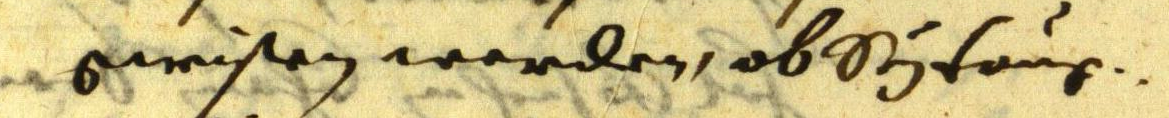gwisen werden, ob Sȳ taūg¬
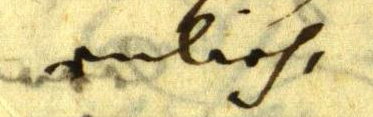enlich,
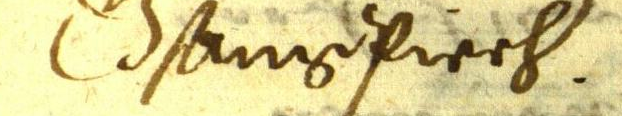GsangPiech.
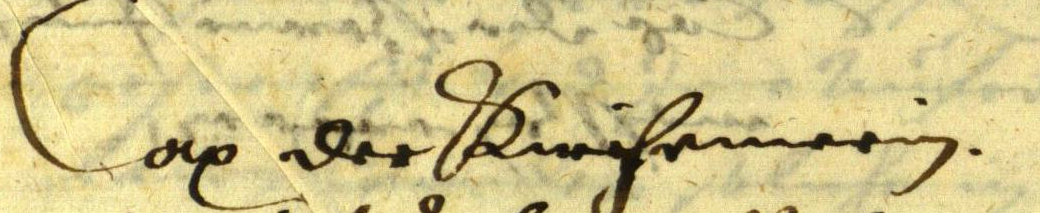Tax der Kirchenwein.
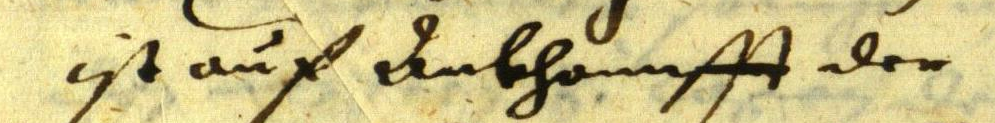ist aūf Ankhonnft der
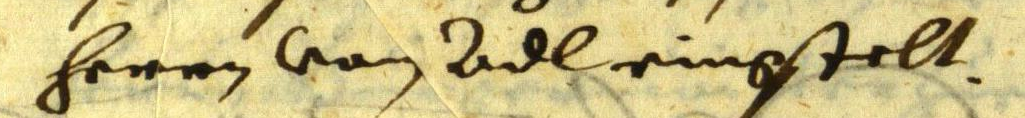herrn vom Adl eingstelt.
